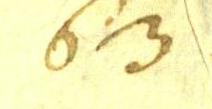63
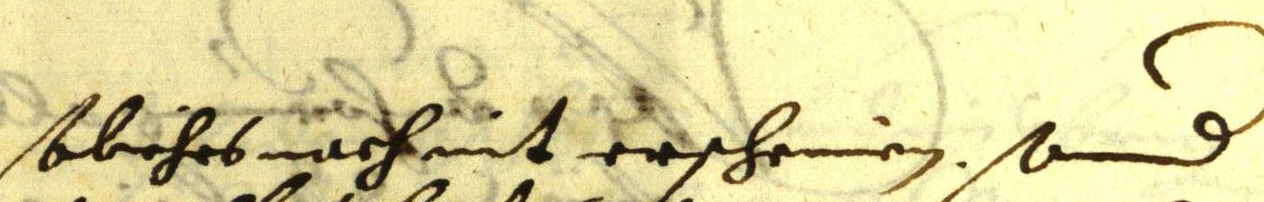soliches noch nit erscheinen. sonnd
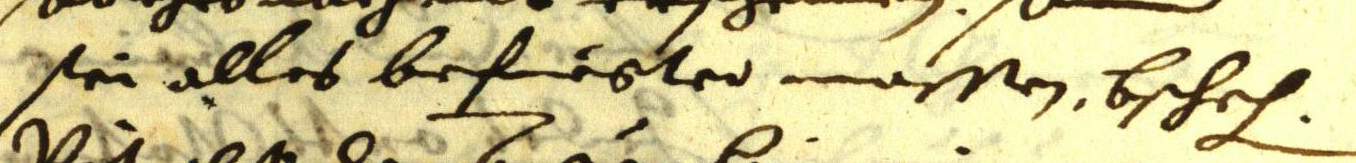sei alles befiegter massen. bscheh.
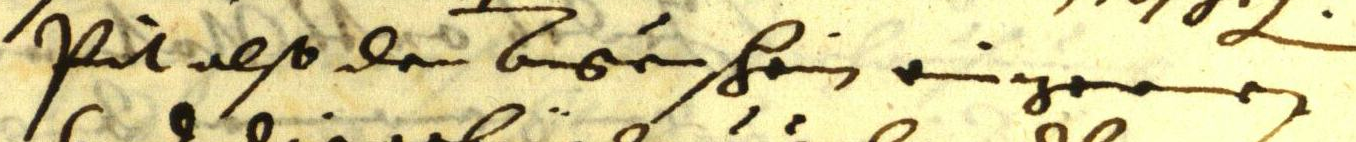Pit also den Aūgenschein einzenemen
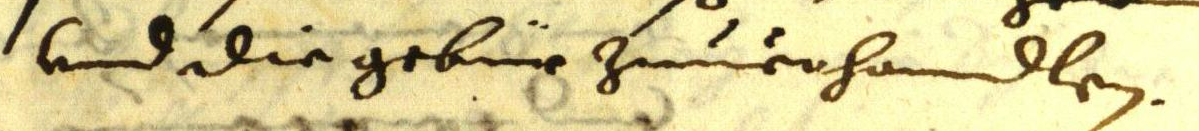vnd die gebür Zuūērhanndlen.
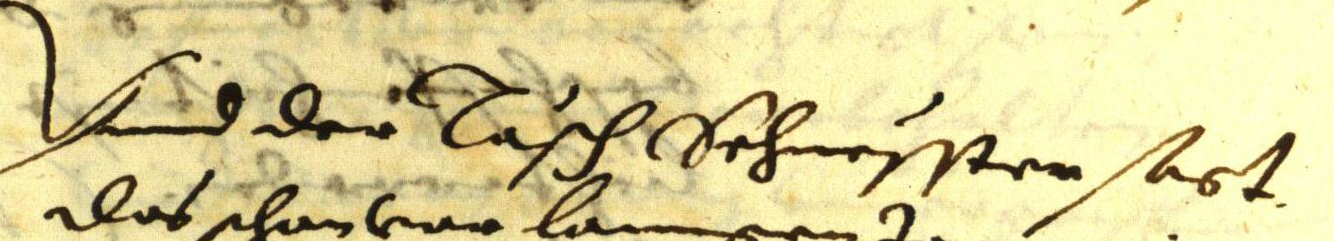Vnnd der Tāsch Schūesster sagt.
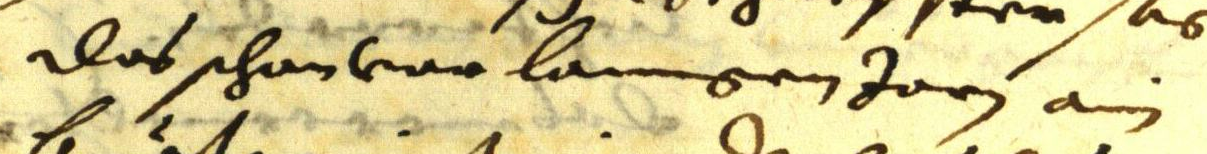das schon vor lanngen Jarn ain
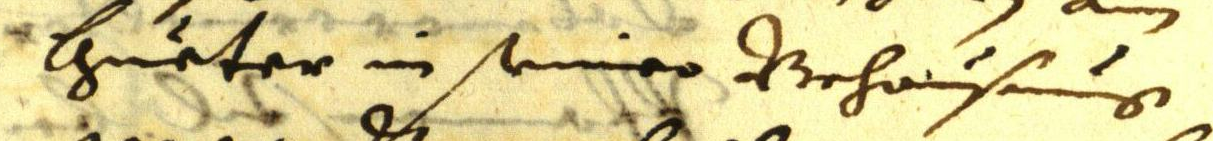Hūeter in seiner Behaūsūng
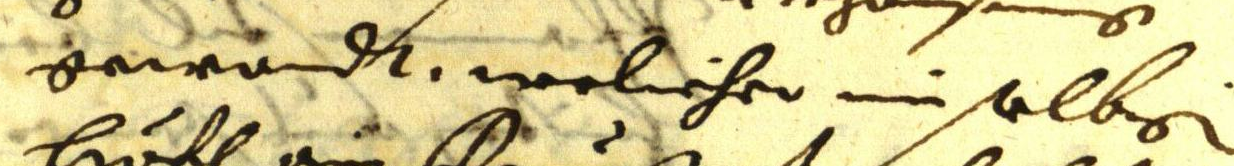gewondt. welicher im selbig
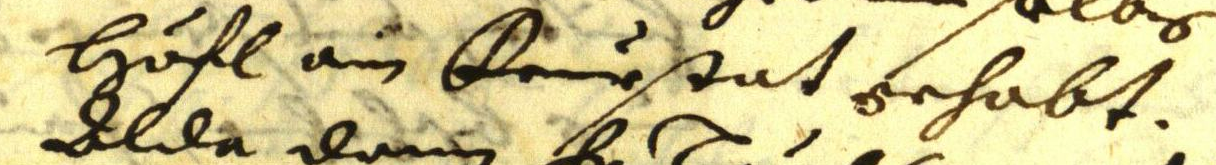Hōfl ain Feūrstat gehabt.
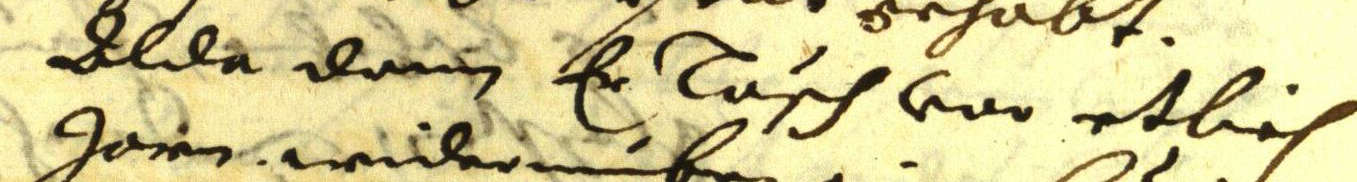Alda dann Er Tāsch vor etlich
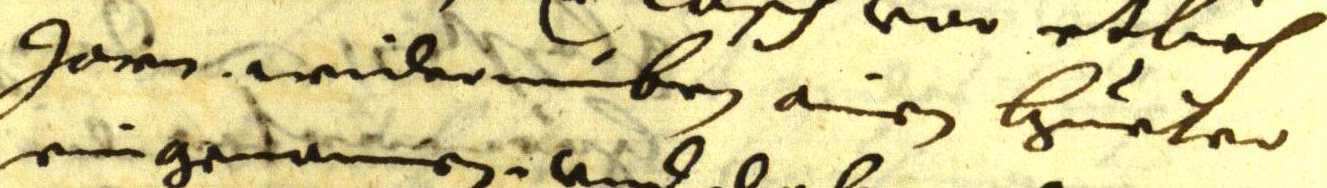Jarn. widerūmben ainen Hūeter
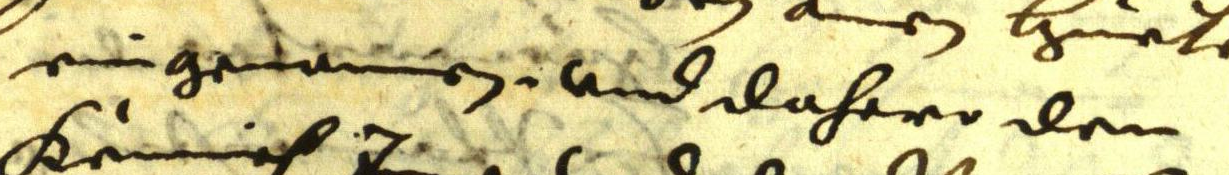eingenommen. vnd dahero den
